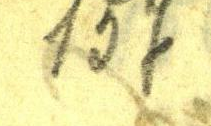157
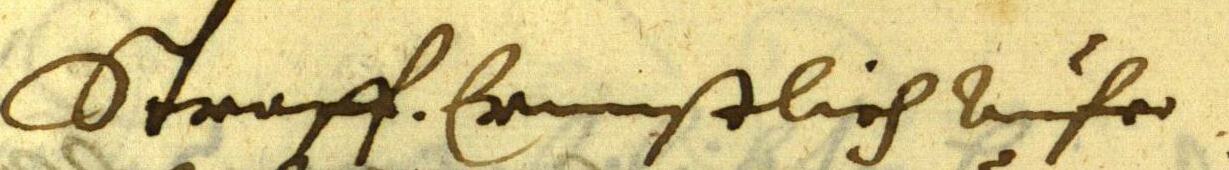Straff. Ernnstlich Aūfer¬
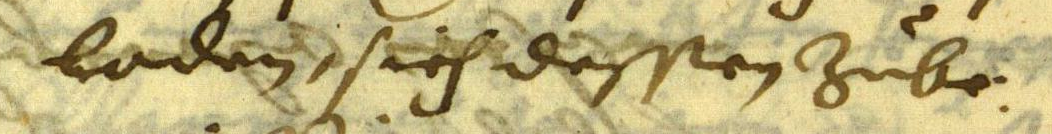laden, sich dessen Zūbe¬
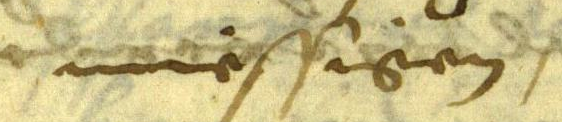miessigen
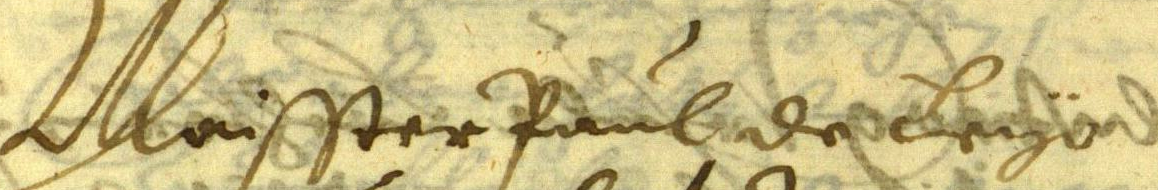Maisster Paūl de Leÿ
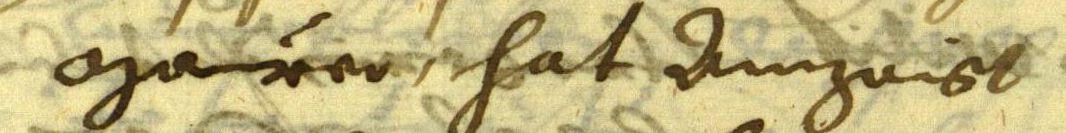Maūrer, hat Anzaigt
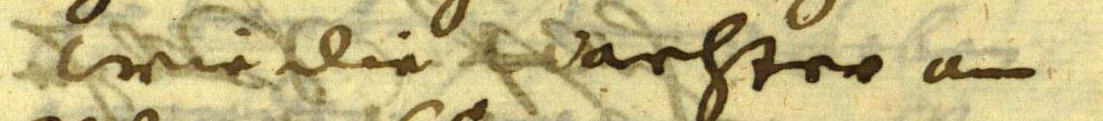wie die Wachter am
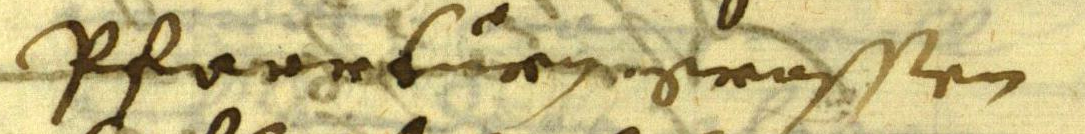Pfarrtūrn grossen
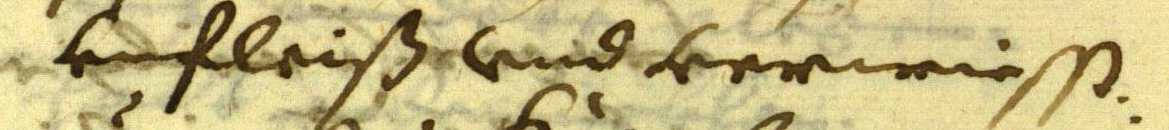vnfleiß vnd verwiesst¬
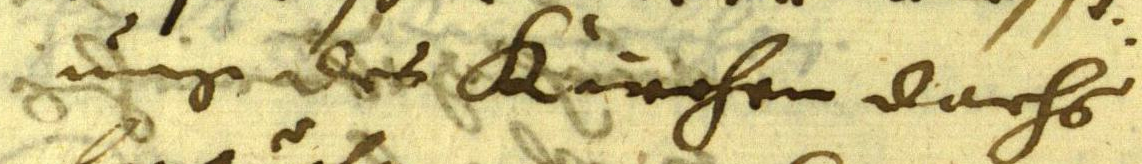ūng des Kirchen dachs
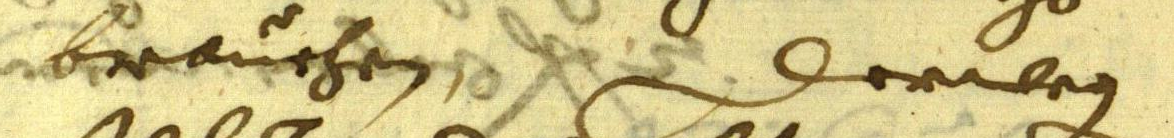braūchen, Derweg
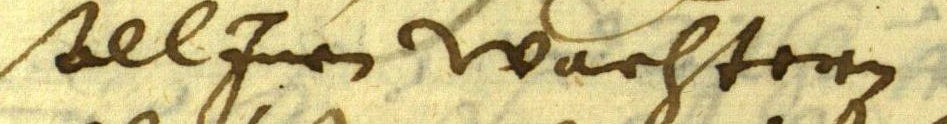soll Inen Wachtern
